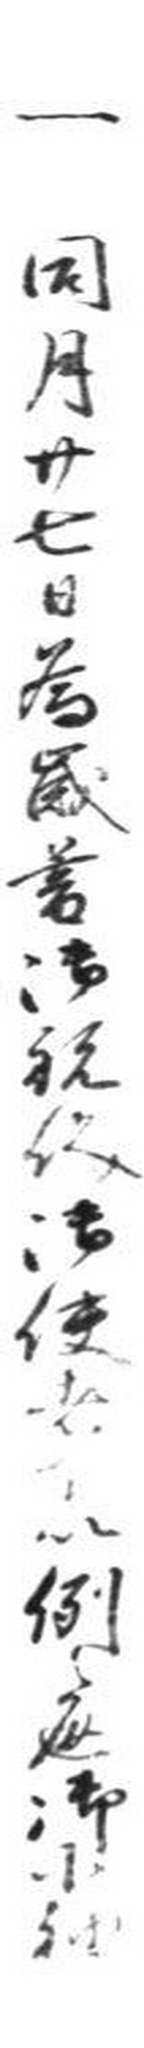一同月廿七日為歳暮御祝儀御使者を以例之通御小袖
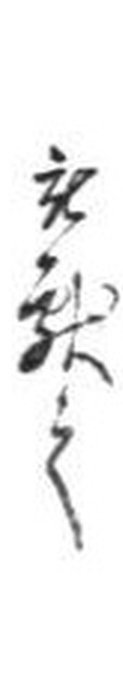被献之
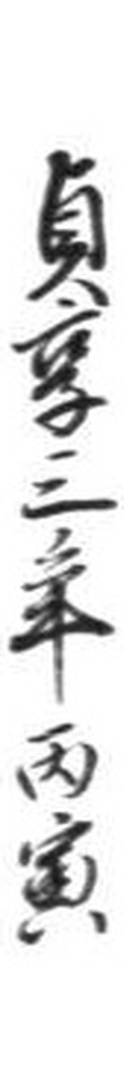貞享三年丙寅
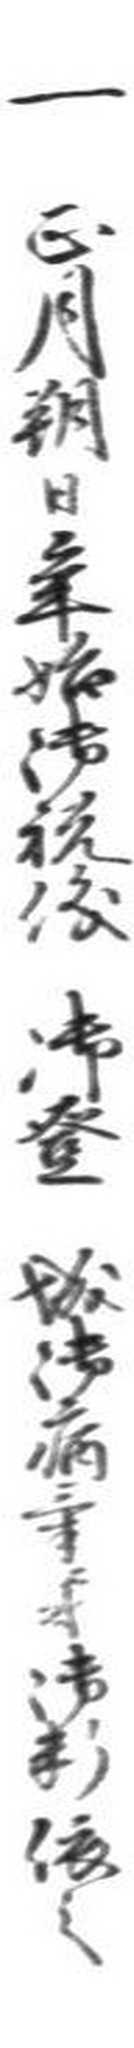一正月朔日年始御祝儀御登城御病気ニ付御断依之
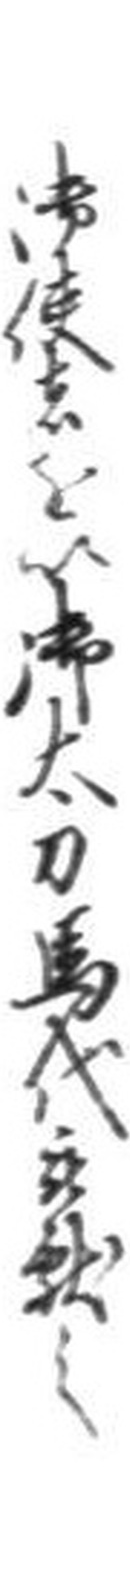御使者を以御太刀馬代被献之
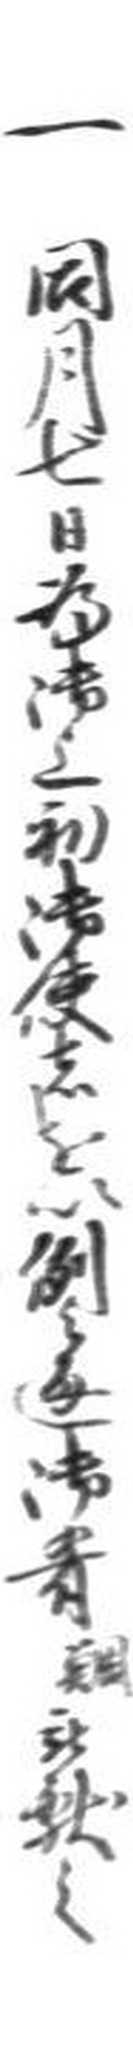一同月七日為御上初御使者を以例之通御肴鯛被献之
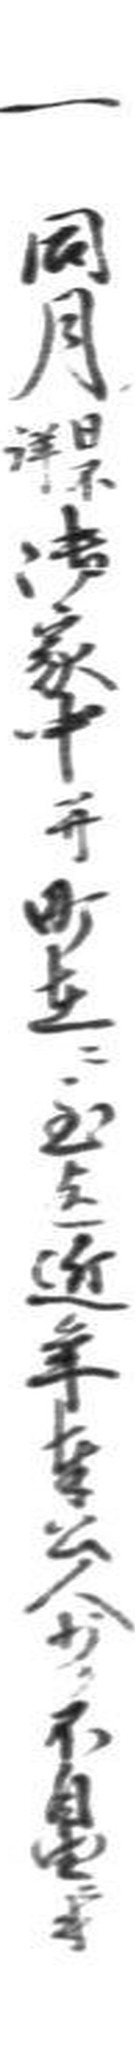一同月日不詳御家中并町在ニ至迄近年奉公人少ク不自由ニ付
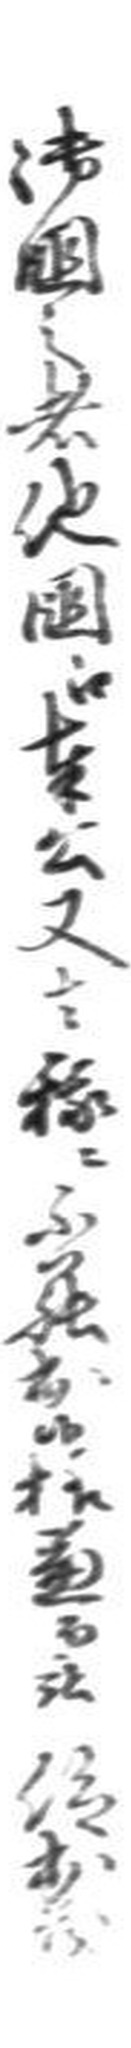御国之者他国江奉公又者稼ニ不罷出候様兼而被仰出も
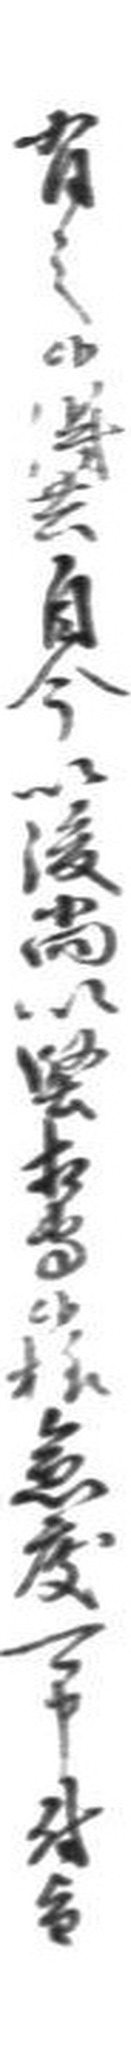有之候得共自今以後尚以堅相守候様急度可申付旨
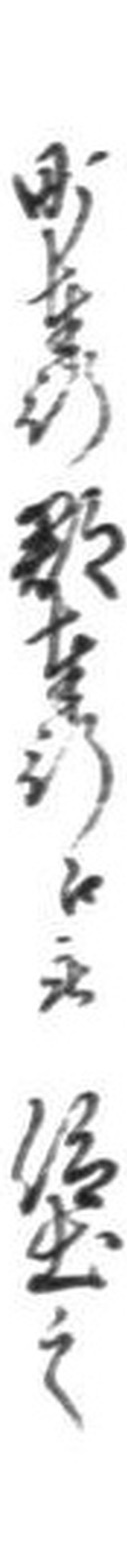町奉行郡奉行江被仰出之

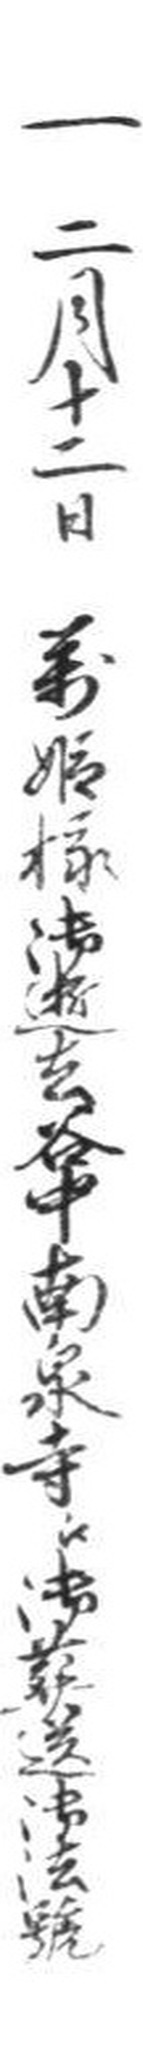一二月十二日万姫様御逝去谷中南泉寺江御葬送御法号
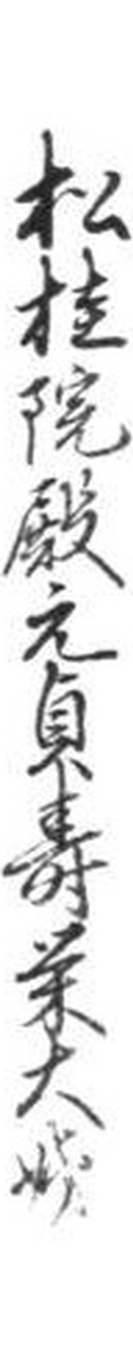松桂院殿元貞寿栄大姉
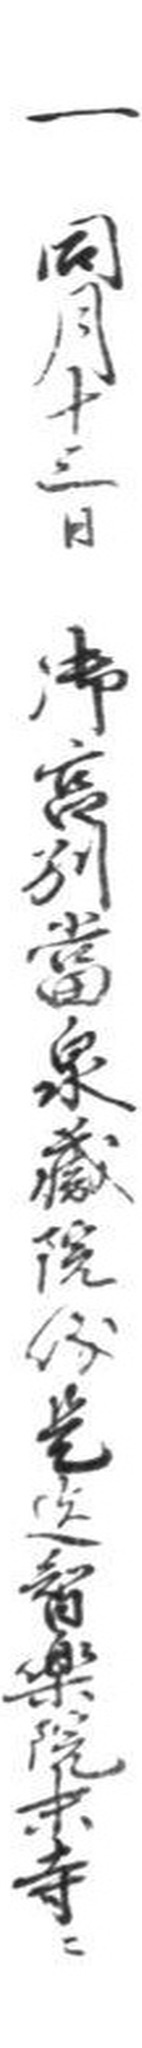一同月十三日御宮別当泉蔵院儀是迄智楽院末寺ニ
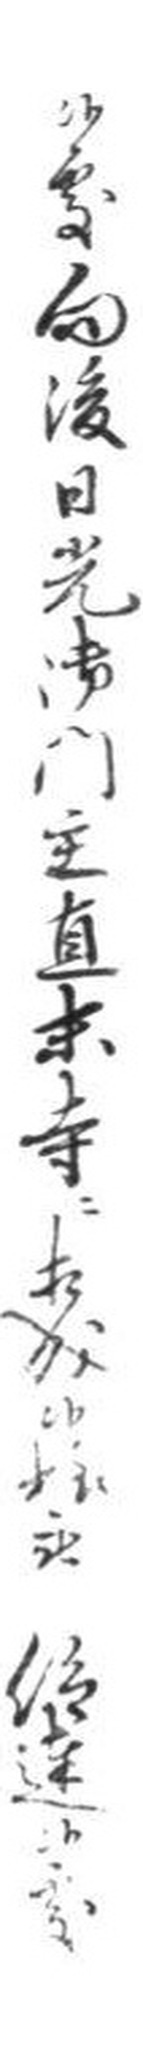候処向後日光御門主直末寺ニ相成候様被仰達候処
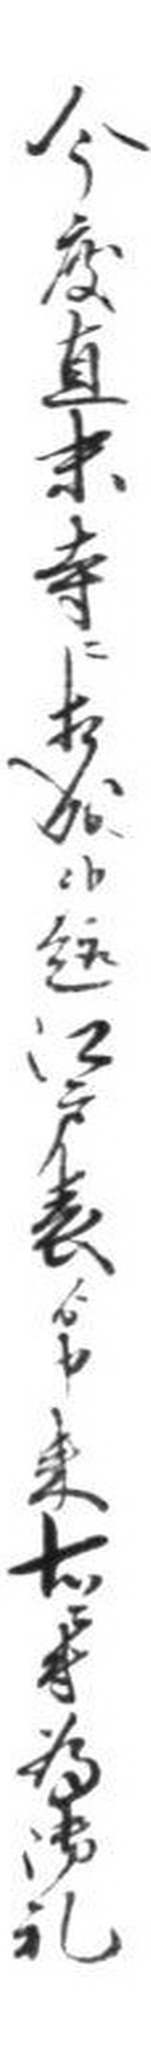今度直末寺ニ相成候趣江戸表ゟ申来右ニ付為御礼
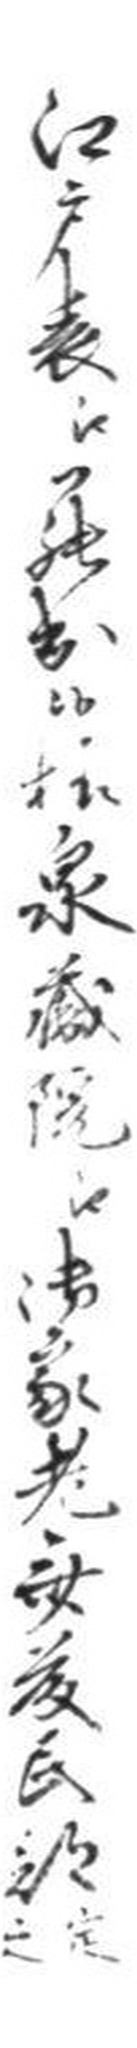江戸表江罷出候様泉蔵院江御家老斎藤民部定之
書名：家譜 十五 綱昌公 従天和元年到元禄十二年
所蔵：福井県文書館 Fukui Prefectural Archives
